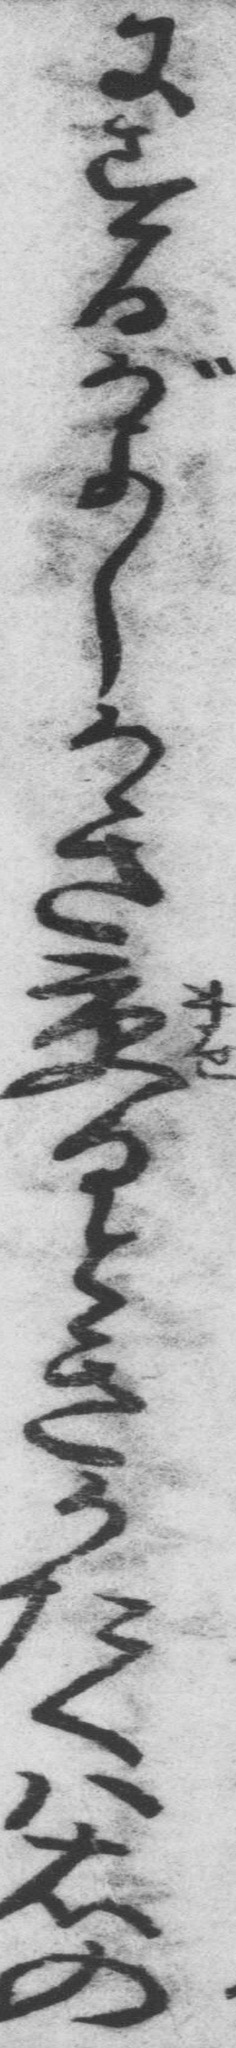にするがよしかき交るときかたくは右の
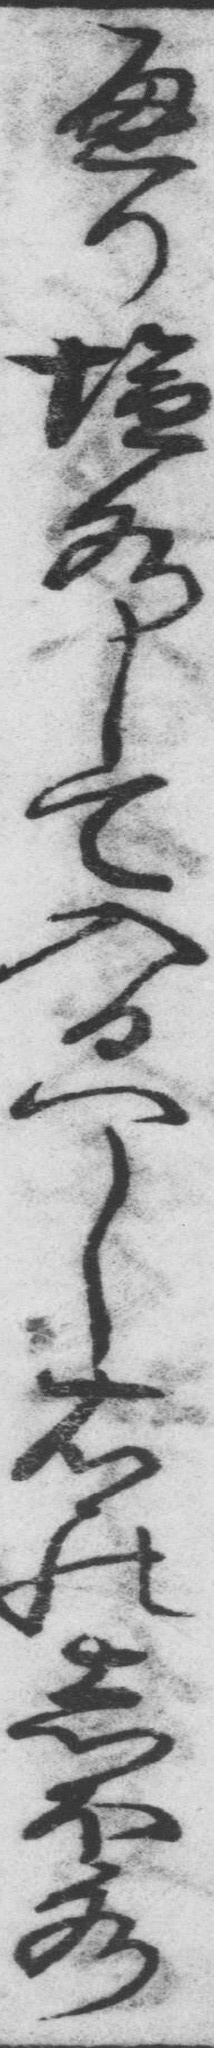通り塩水して入るへし右のしほ水
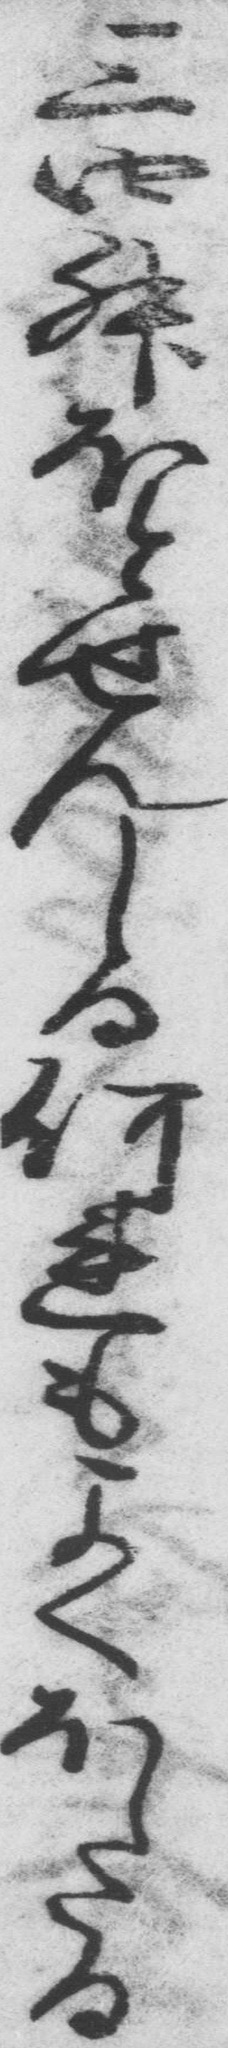三四升ほとせんしる何れもよくほしたる
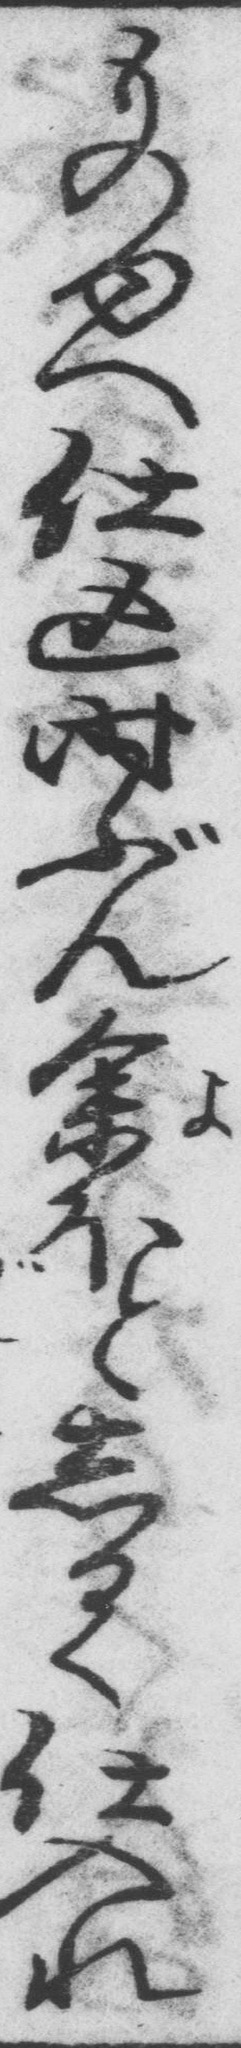ものゆへ仕込時ぶん余ほとしるへ仕入れ
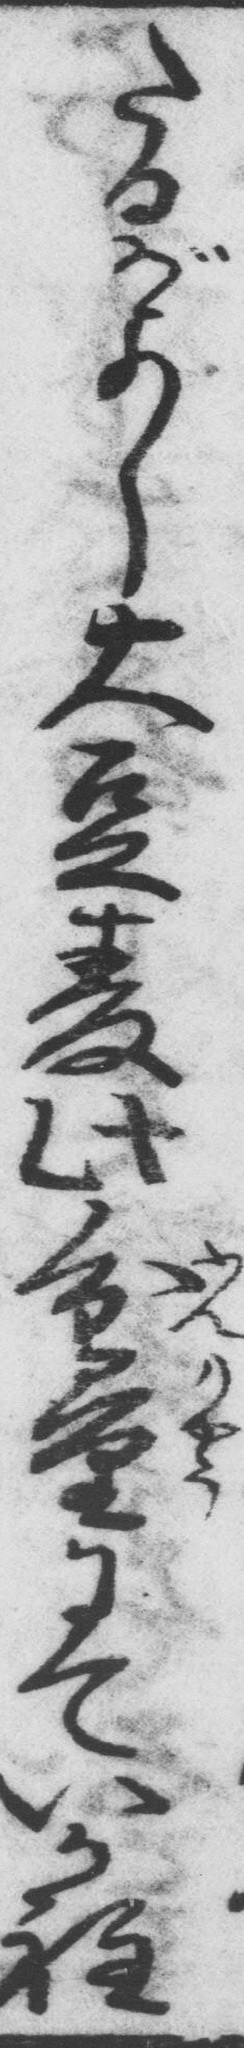たるがよし大豆麦此分量にていか程
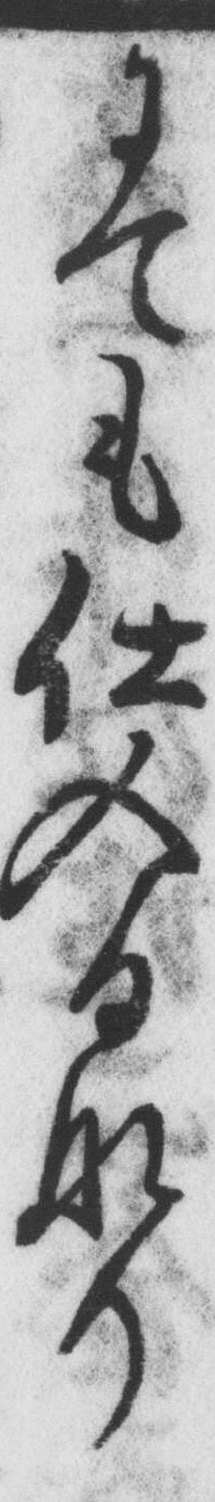にても仕入るなり
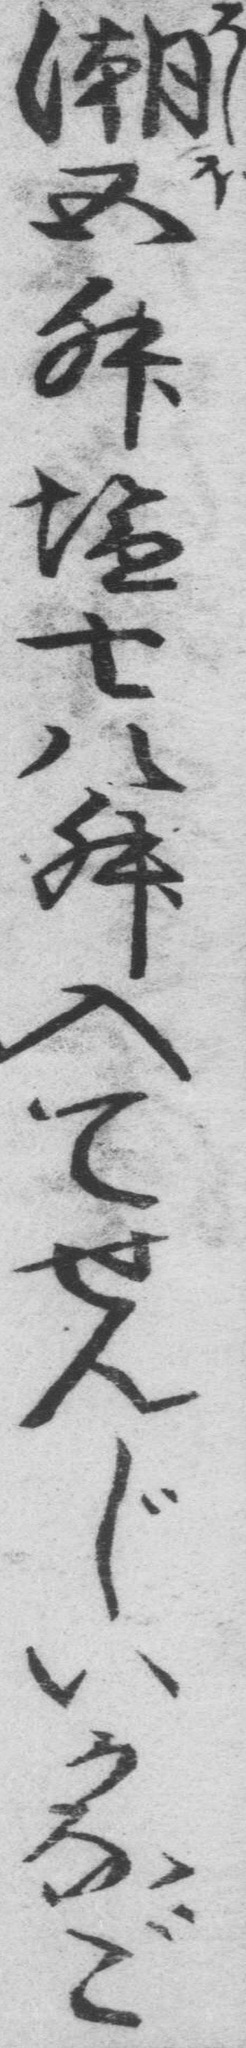潮五升塩七八升入てせんじいかなご
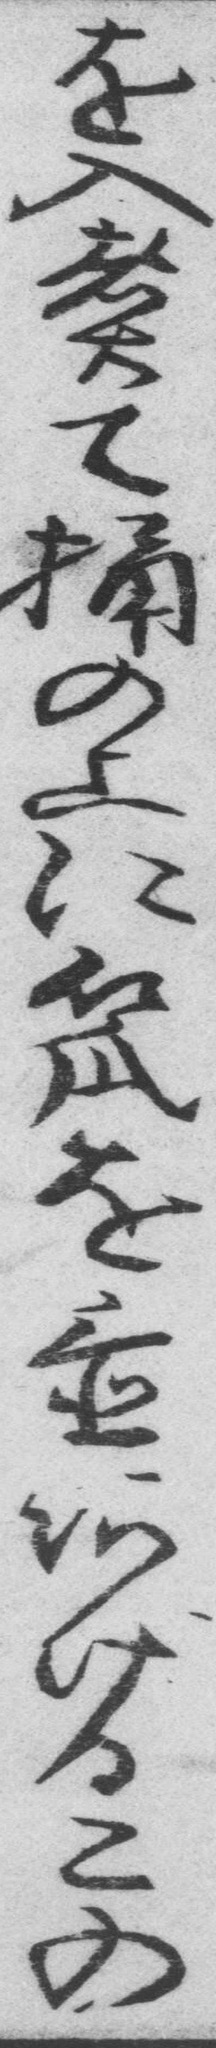を入煮て桶の上に笊を置あげるこの
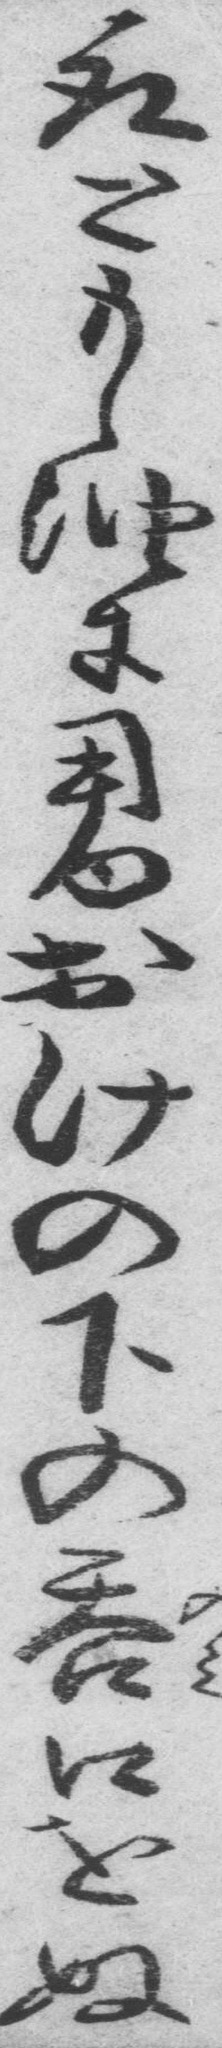取ともし油に用ゆおけの下の呑口をぬ
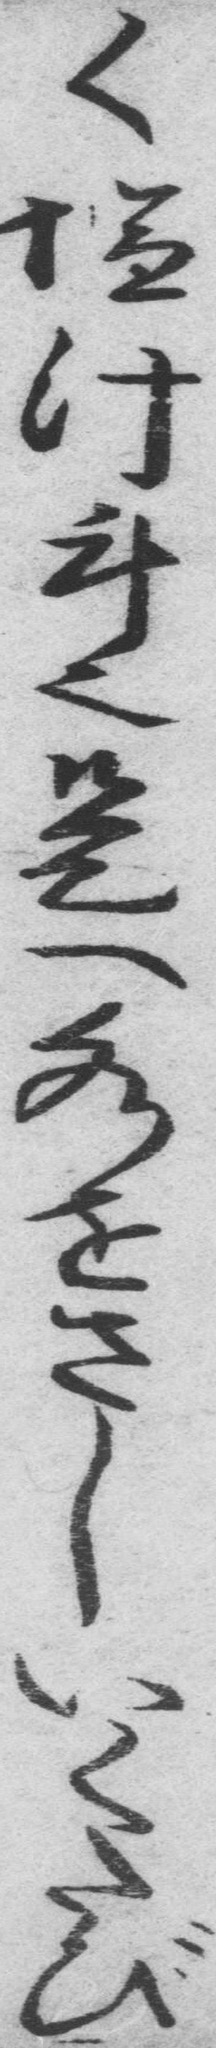く塩汁斗也是へ水をさしいくたび
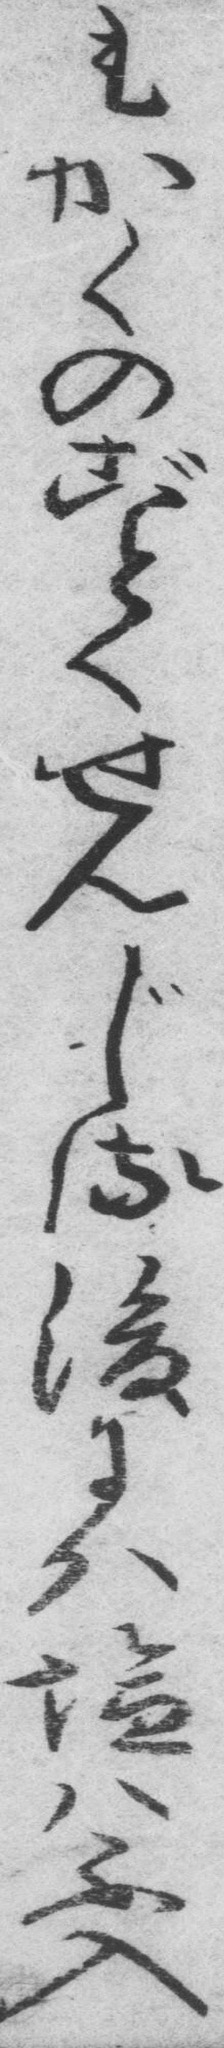もかくのごとくせんじる後には塩は不入
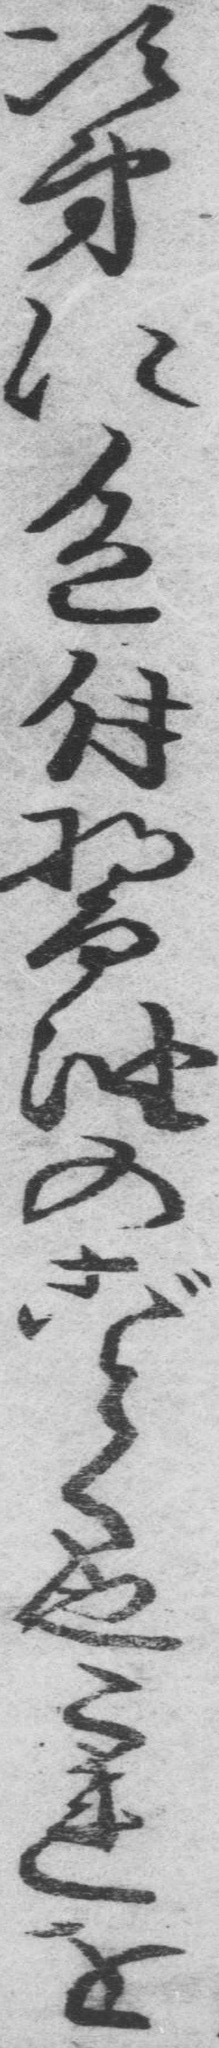次第に色付醤油のごとく也これを
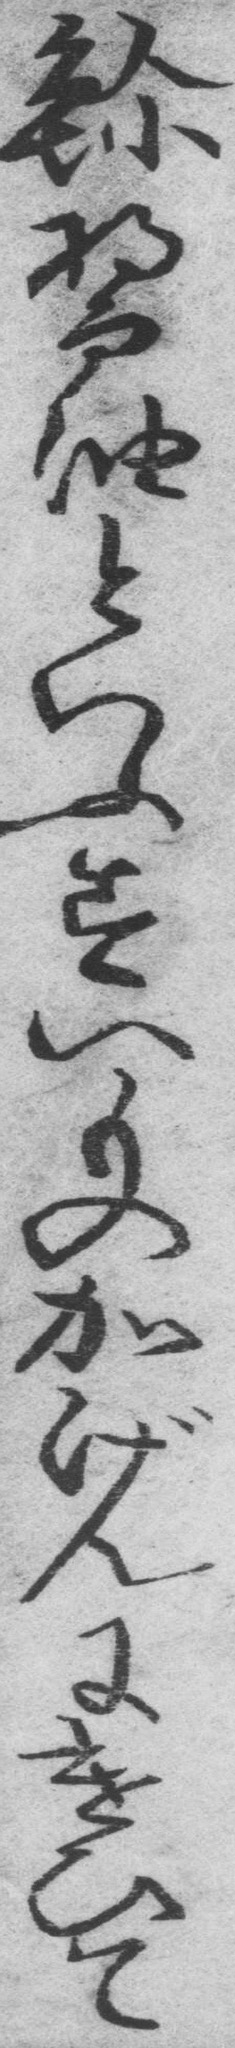醤油といふすいものかげんに遣ひて
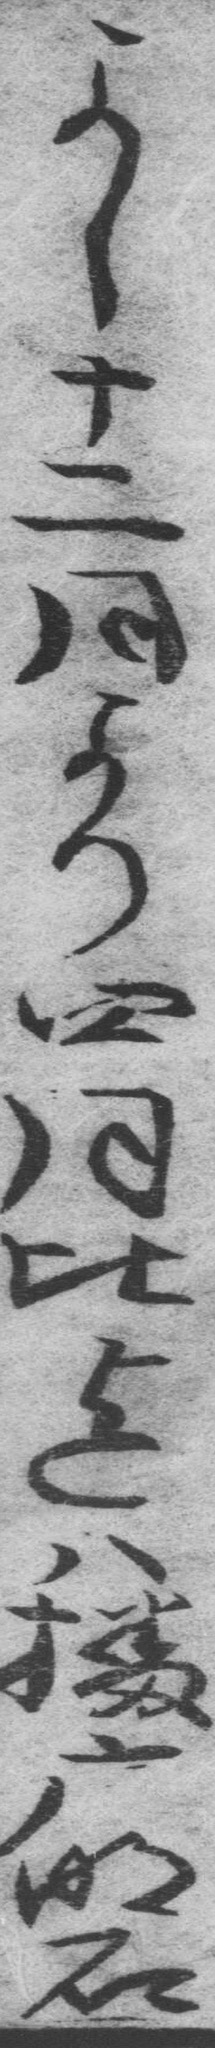よし十二月より四月比迄は播磨明石

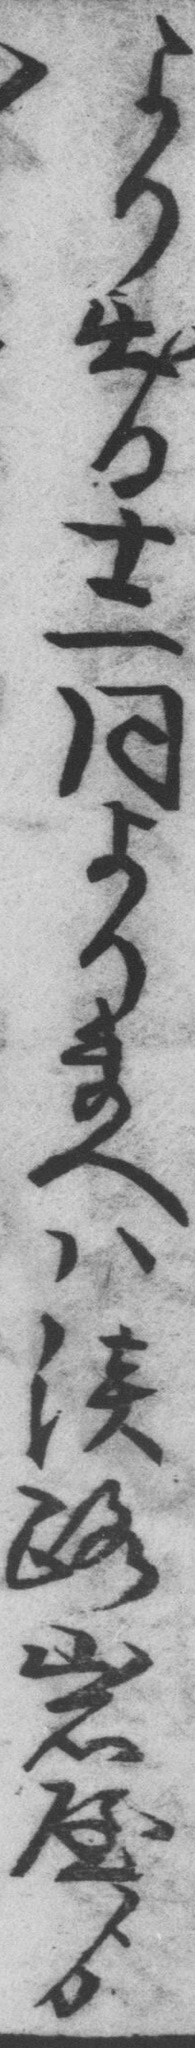より出る十二月よりまへは淡路岩屋ゟ
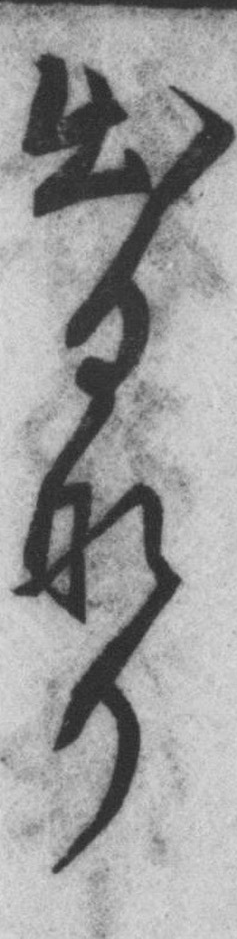出るなり
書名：料理山海郷
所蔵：大阪府立大学学術情報センター 国文学研究資料館
